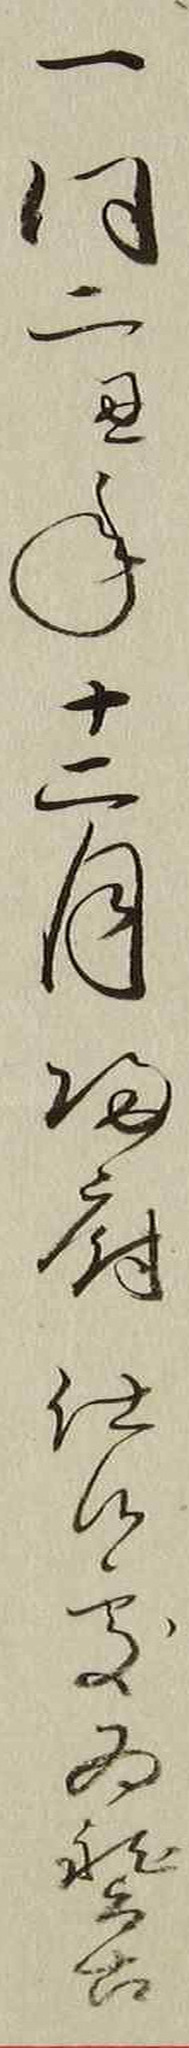一同二丑年十二月帰府仕候処為稽古
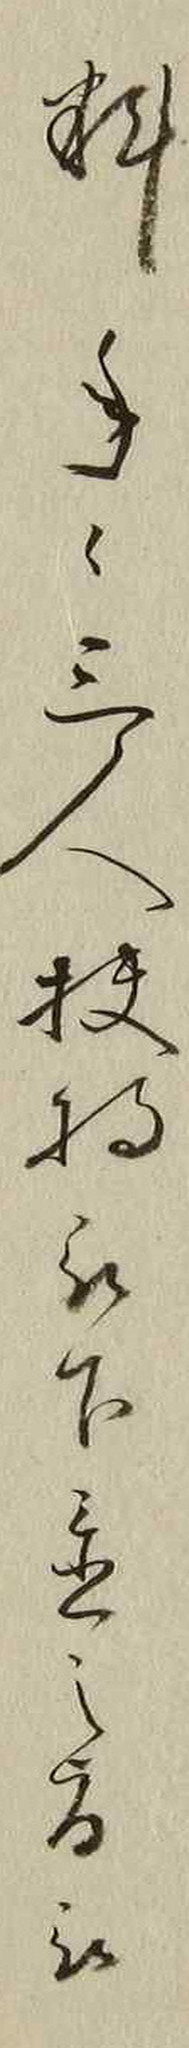料年々三人扶持被下置之旨被
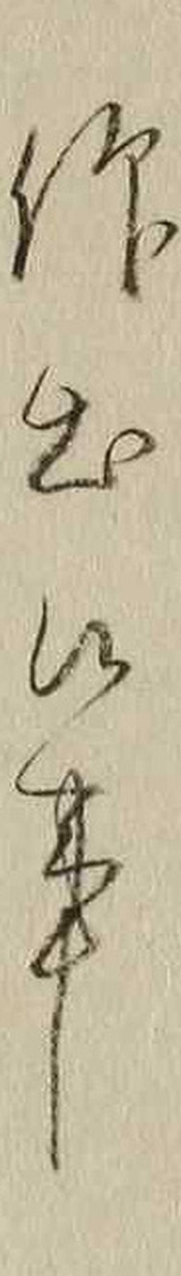仰出候事
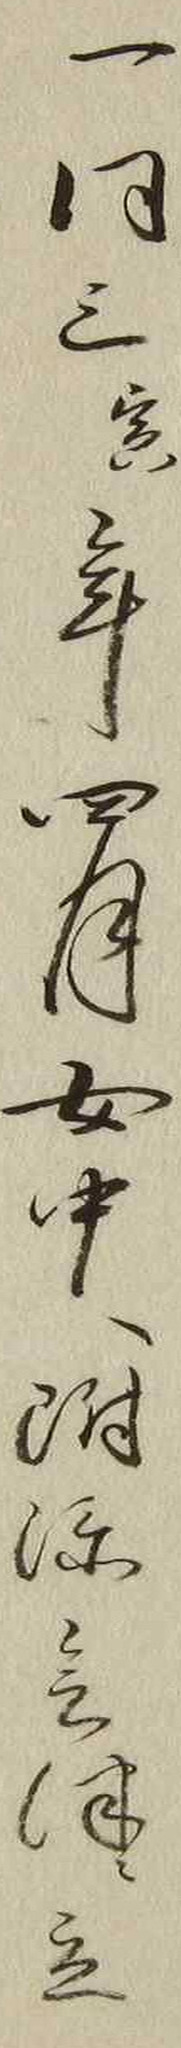一同三寅年四月女中へ附添会津ニ立
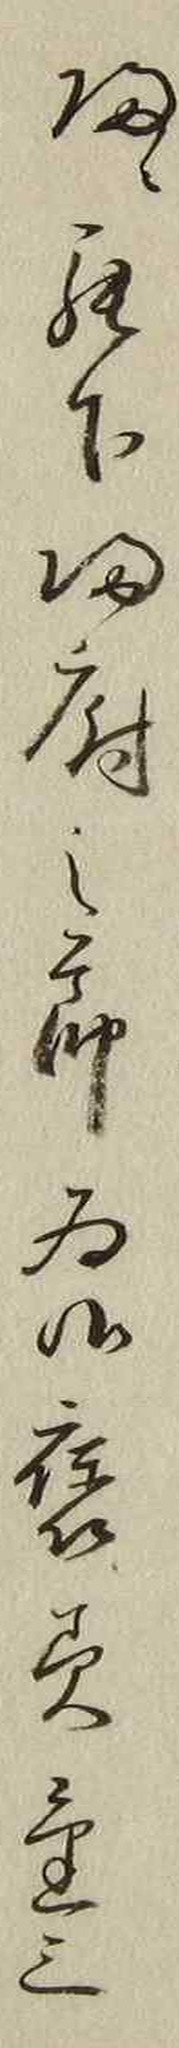帰ニ罷下帰府之節為御褒美金三
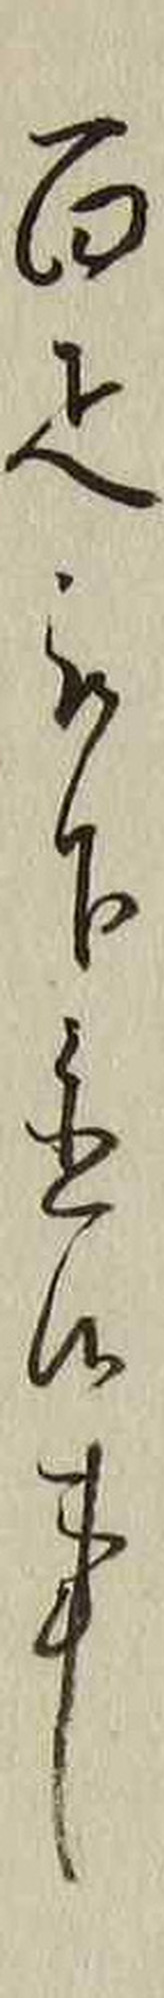百疋被下置候事
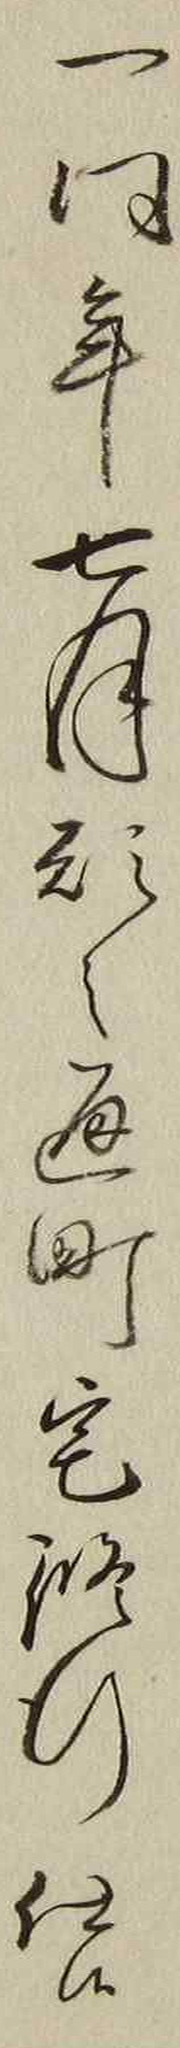一同年七月願之通町宅修行仕候
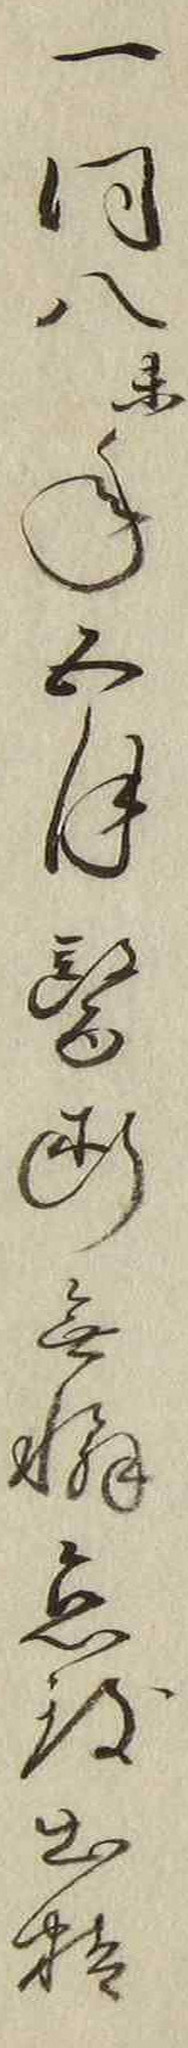一同八未年五月医術無懈怠致出精
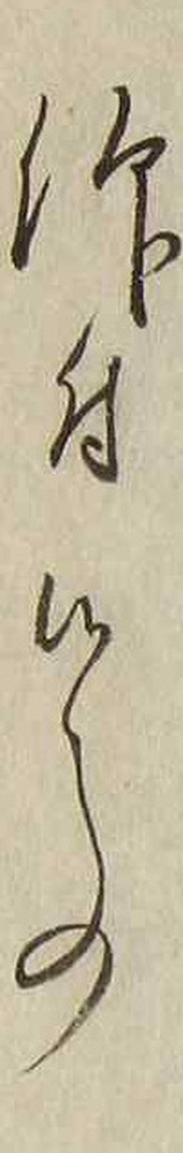仰付候事

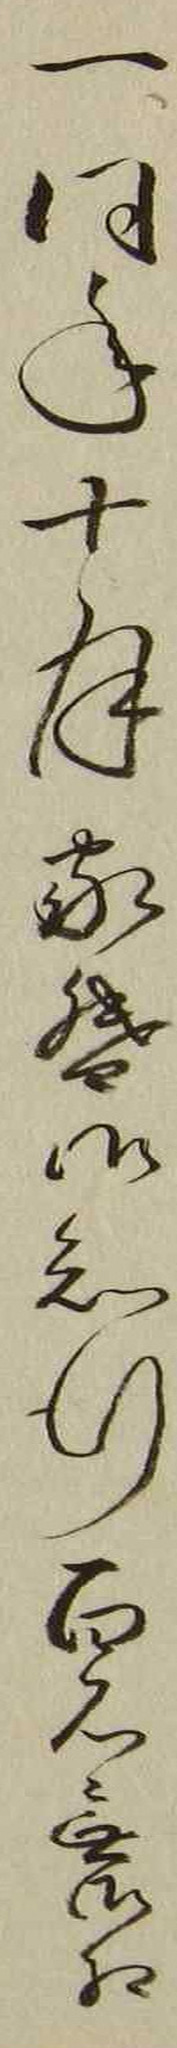一同年十月家督御知行百石無御相
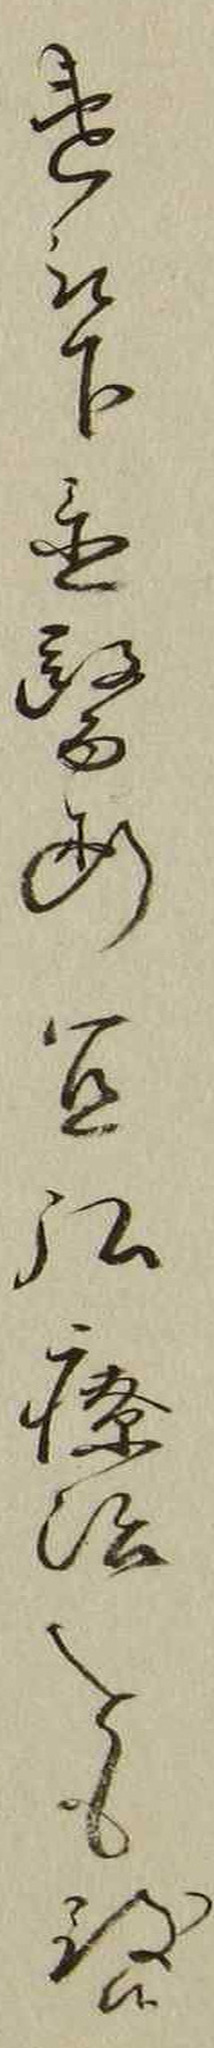違被下置医術宜弘療治をも致候
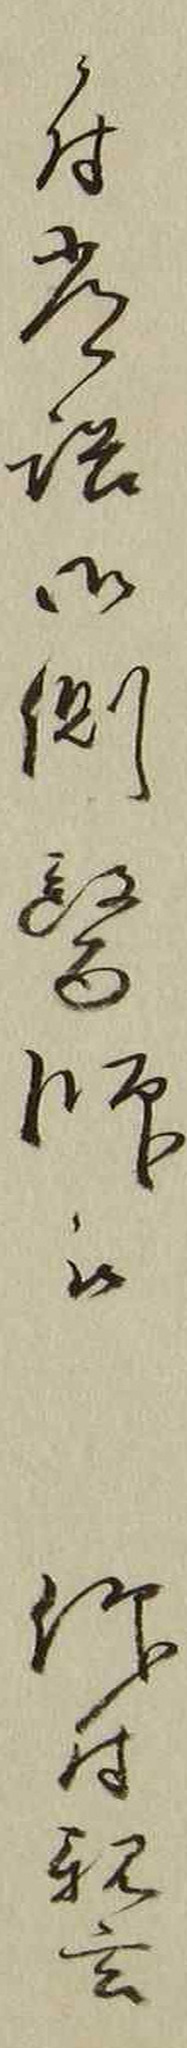ニ付常詰御側医師被仰付親玄
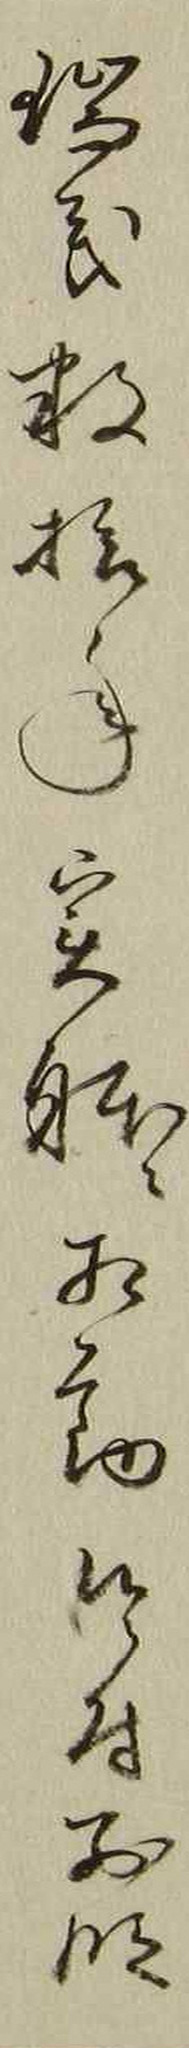瑞も数拾年実体ニ相勤候ニ付別段
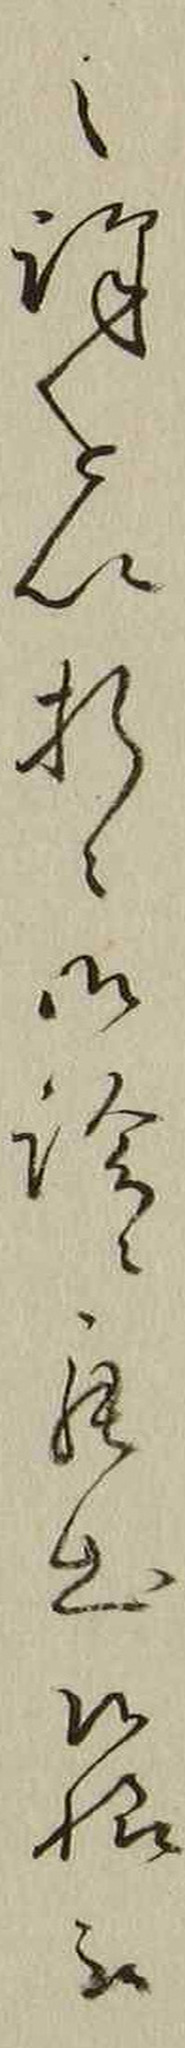之訳を以折々御診ニ罷出候様被
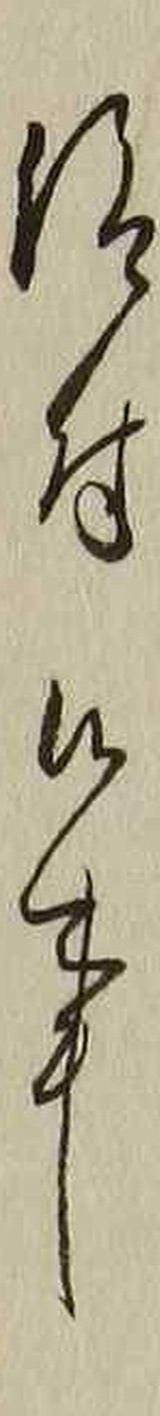仰付候事
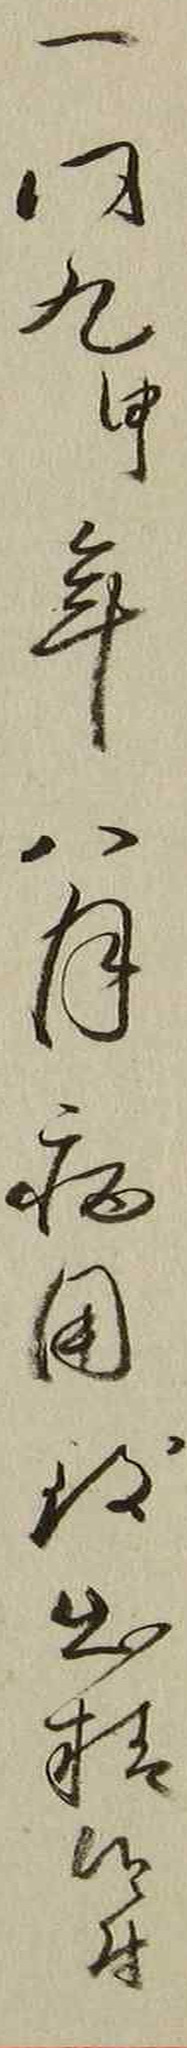一同九申年八月病用致出精候ニ付
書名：諸士系譜　巻之8　い之部8
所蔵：会津若松市立会津図書館
